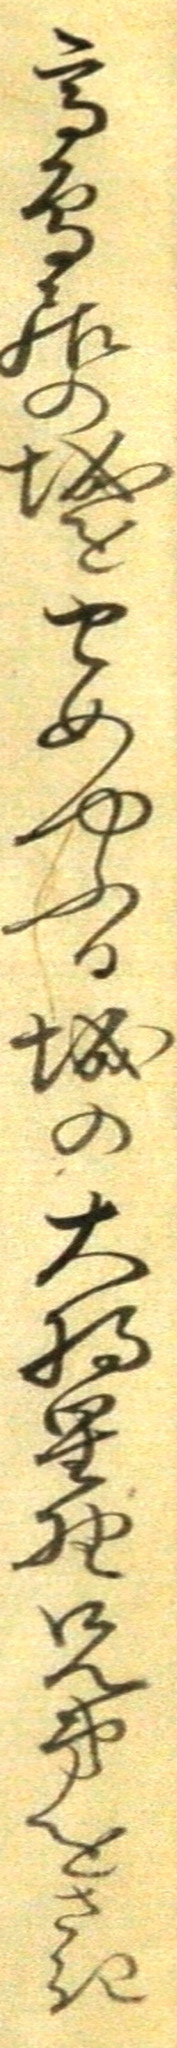高鳥居の城をせめやふる城の大将星野兄弟をさき
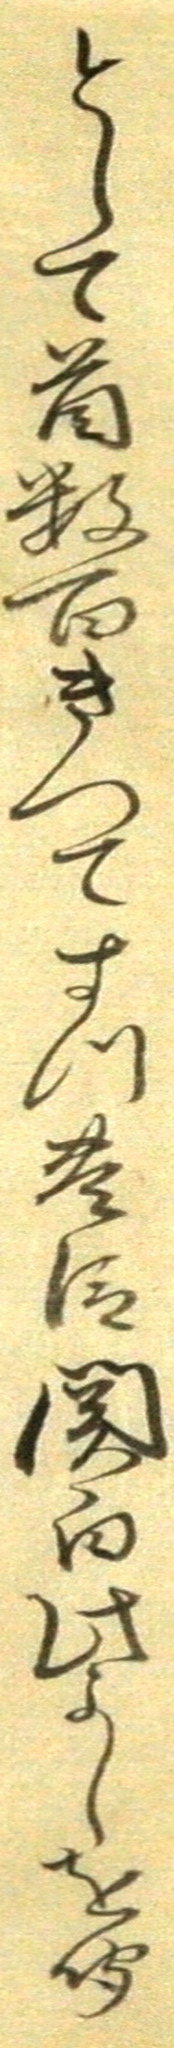として首数百きつてすつ豊臣関白此よしを聞
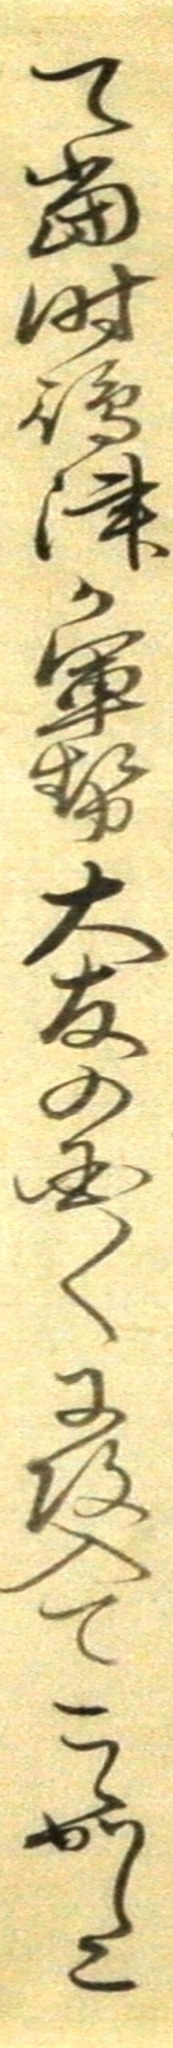て当時島津か軍勢大友の国〳〵に攻入てこゝかしこ
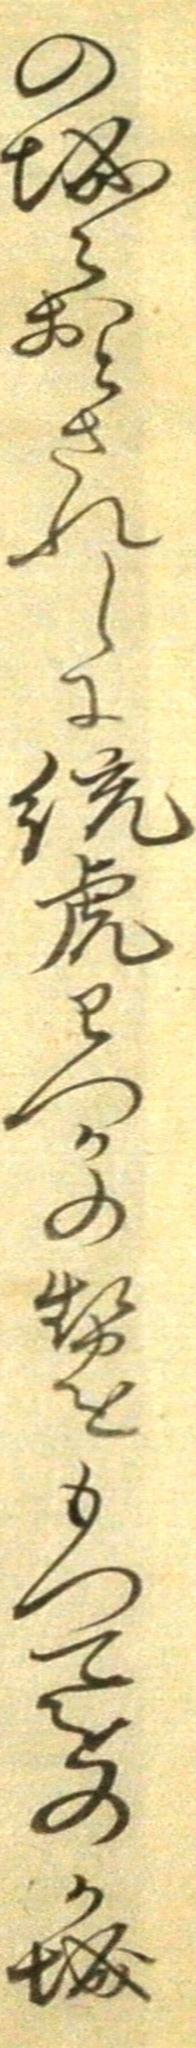の城々おとされしに統虎わつかの勢をもつてをのか城
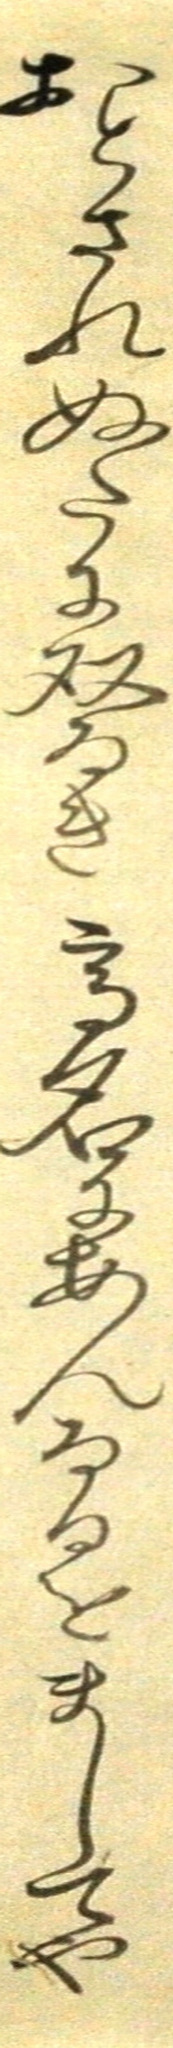おとされぬたに双なき高名にあんなるをましてや
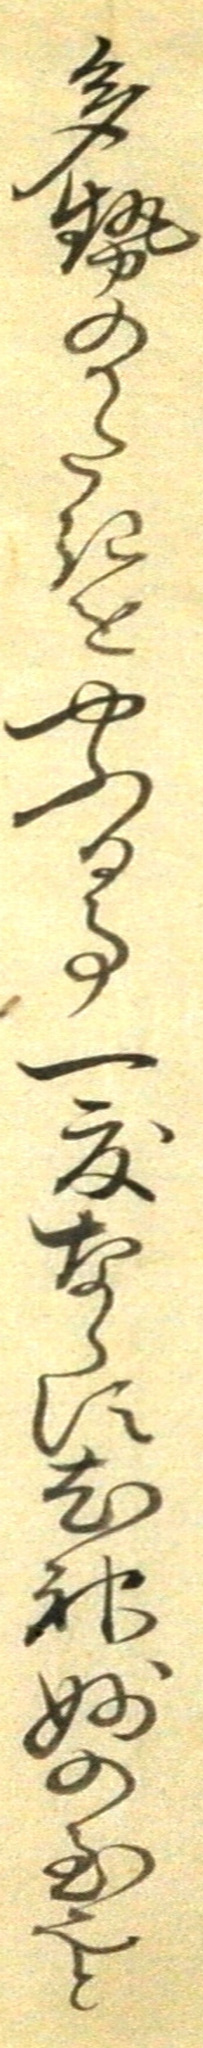多勢のかたきをやふる事一度ならす尤神妙の国也と
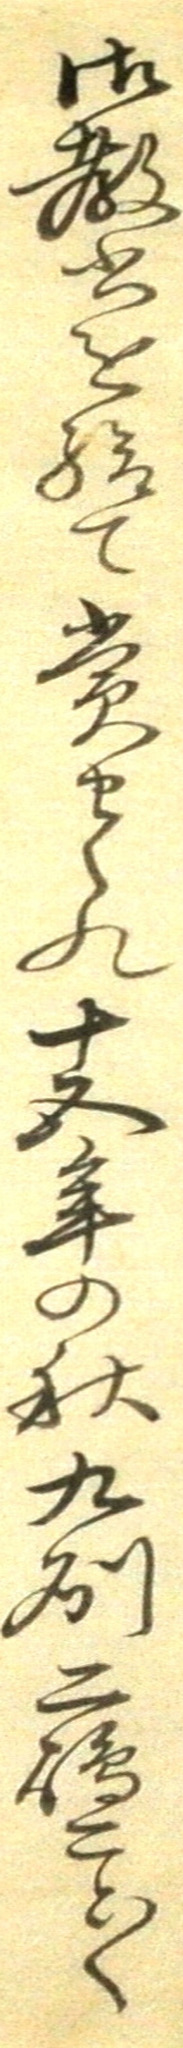御教書を給て賞せられ十五年の秋九州二島こと〳〵
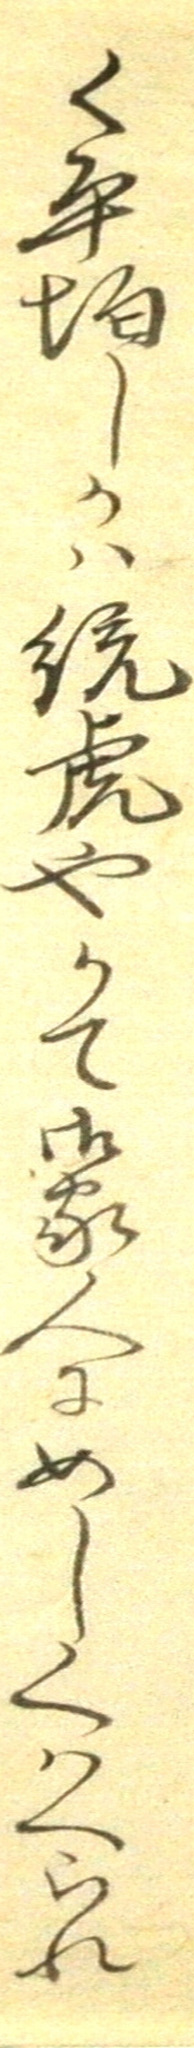く平均しかは統虎やかて御家人にめしくはへられ
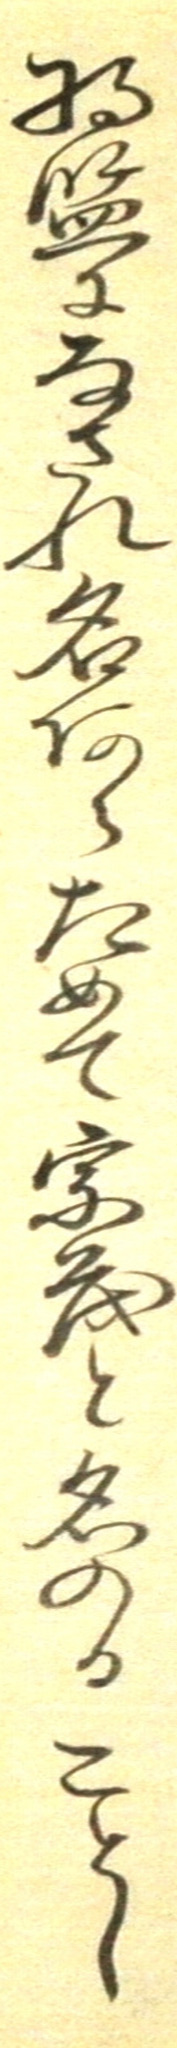将監になされ名あらためて宗茂と名のることし
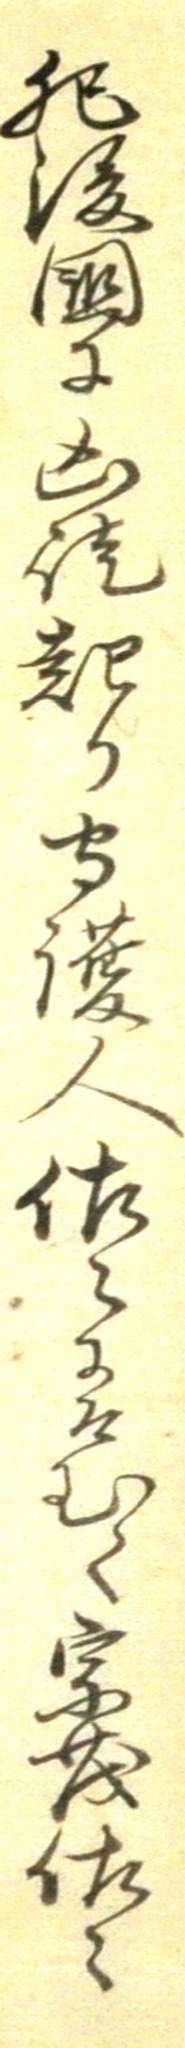肥後国に凶徒起り守護人佐々にそむく宗茂佐々
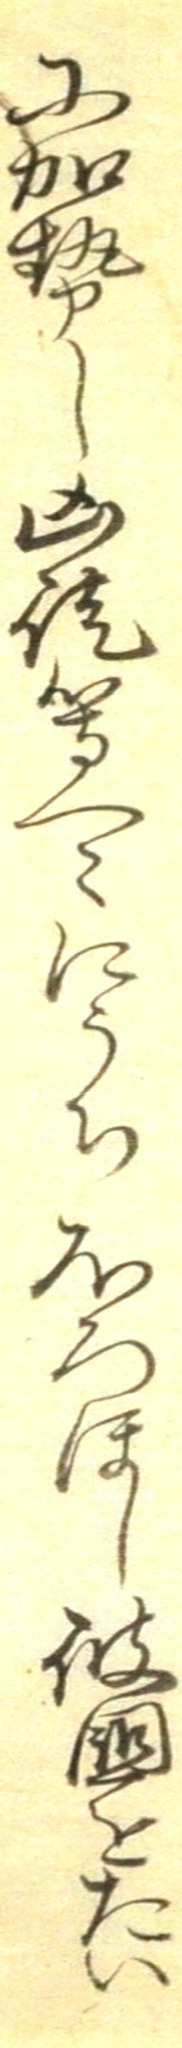に加勢し凶徒等一々にうちほろほし彼国をたい
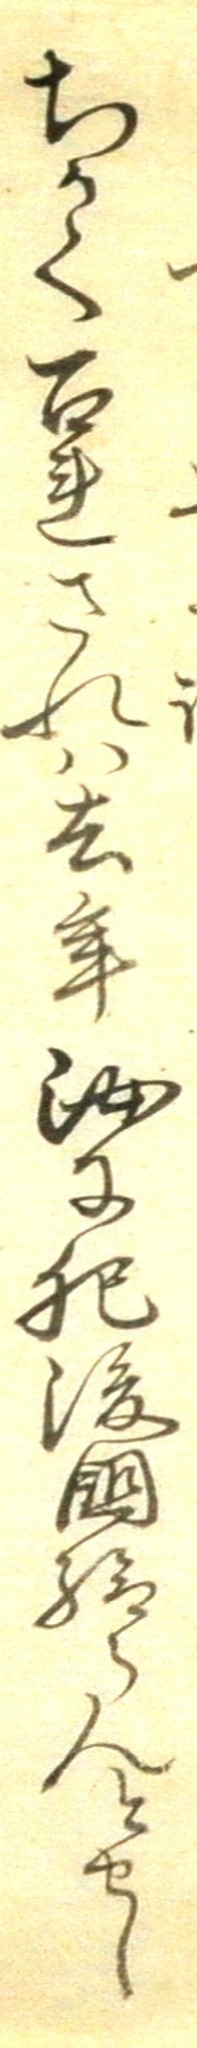ちかく召れされは去年汝に肥後国給らんとせし
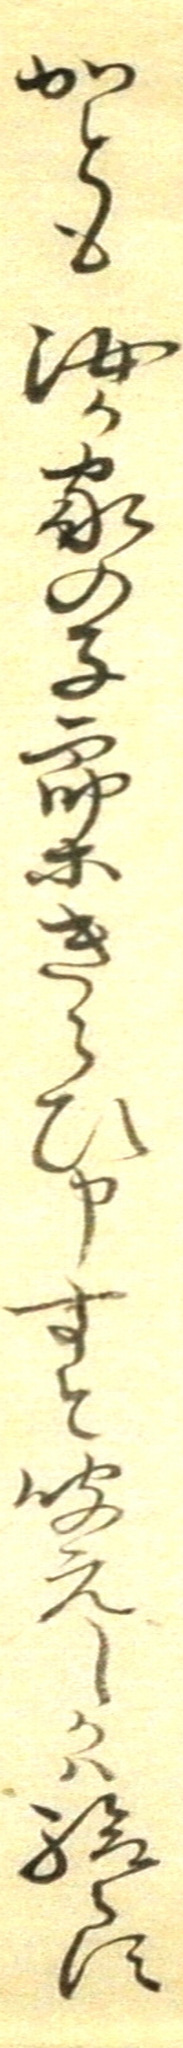かとも汝か家の子郎等きらひ申すと聞えしかは給らす
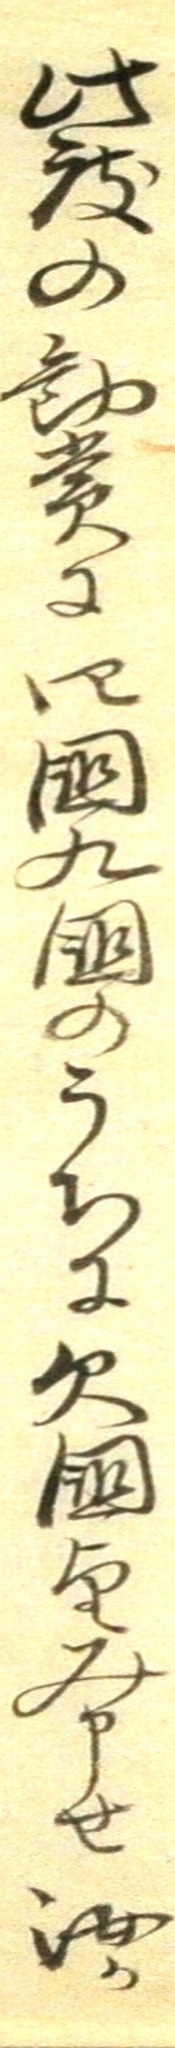此度の勧賞に四国九国のうちに欠国望み申せ汝か
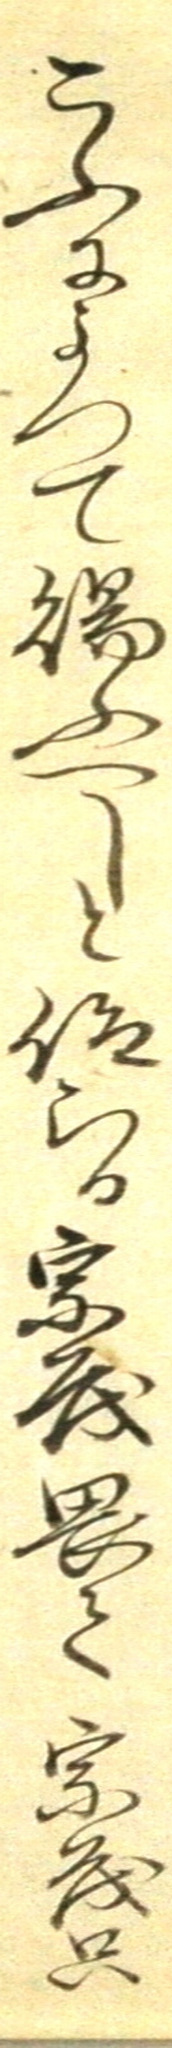こふによつて賜ふへしと仰らる宗茂畏て宗茂只
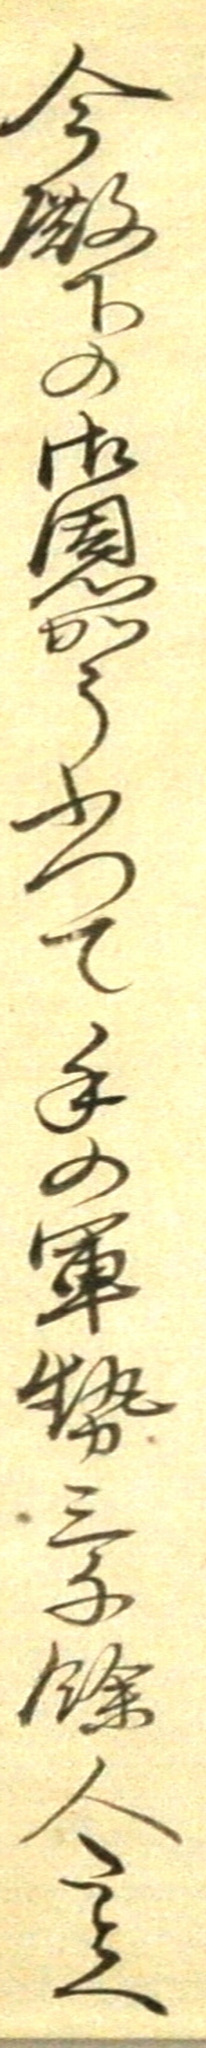今殿下の御恩かうふつて手の軍勢三千余人たとへ
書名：藩翰譜（八・下）
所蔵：伊那市立高遠町図書館・合同会社AMANE
